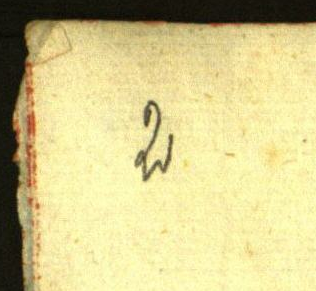2
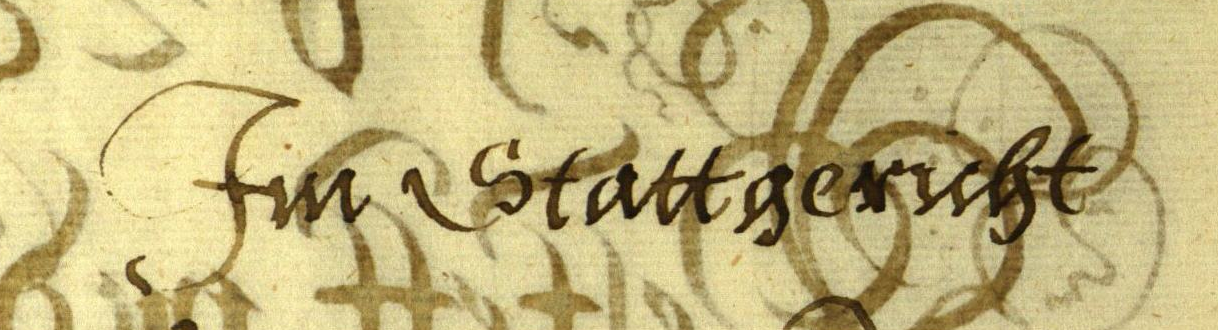Im Stattgericht
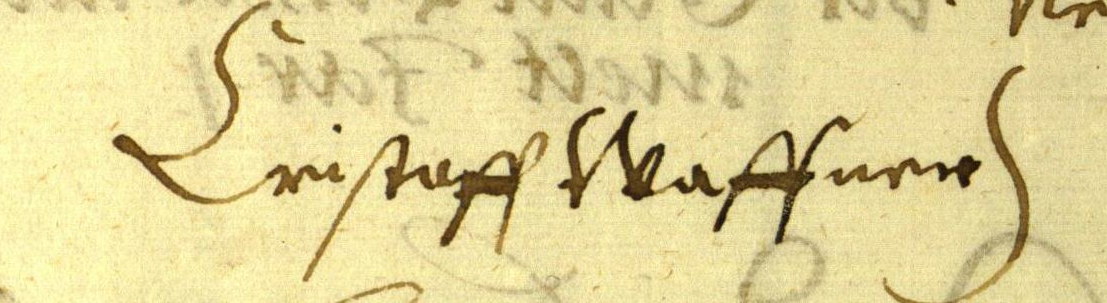Cristoff Waffner
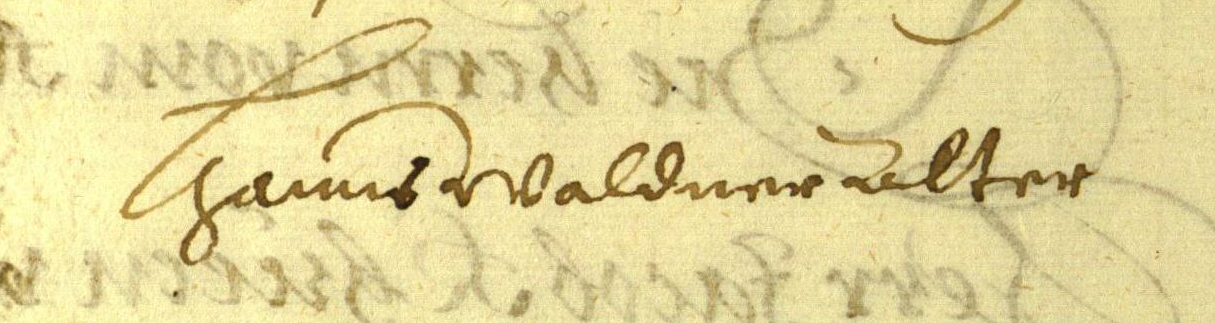Hanns Waldner Alter
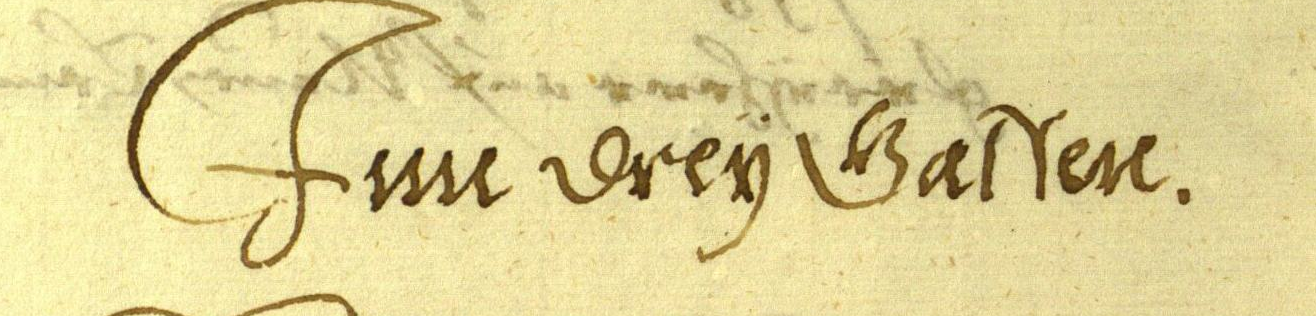Inn dreÿ Gassen.
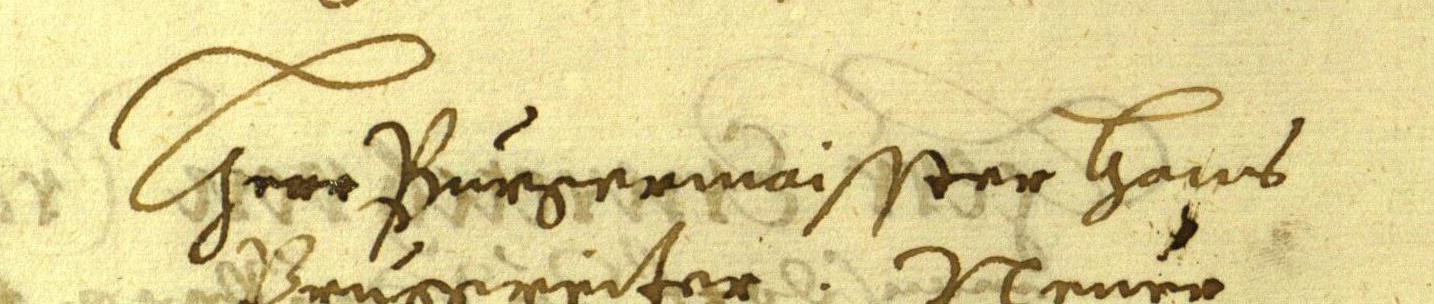Herr Būrgermaister Hans
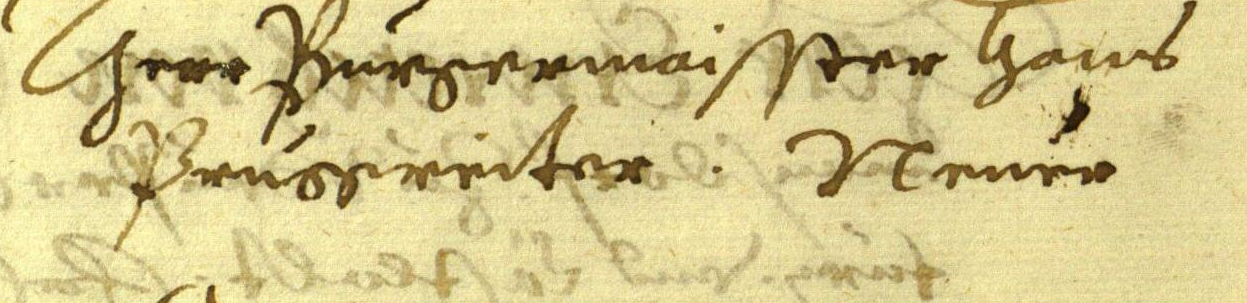Prūggreiter. Neūer
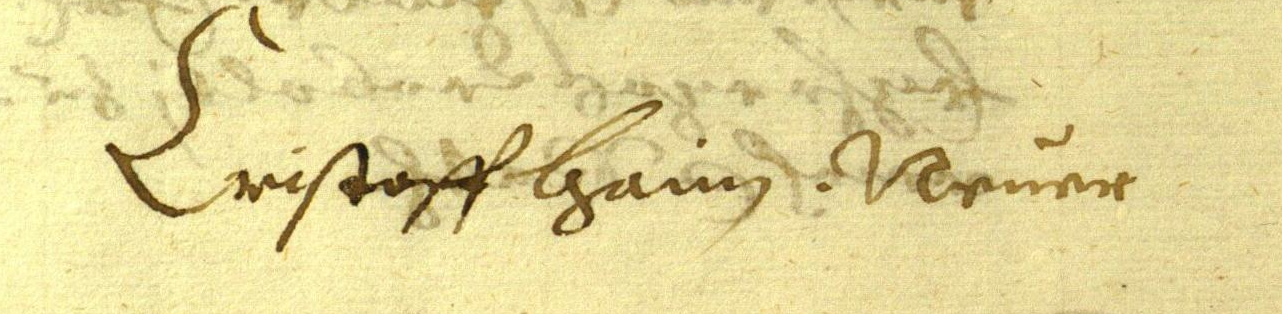Cristoff Haim. Neūer
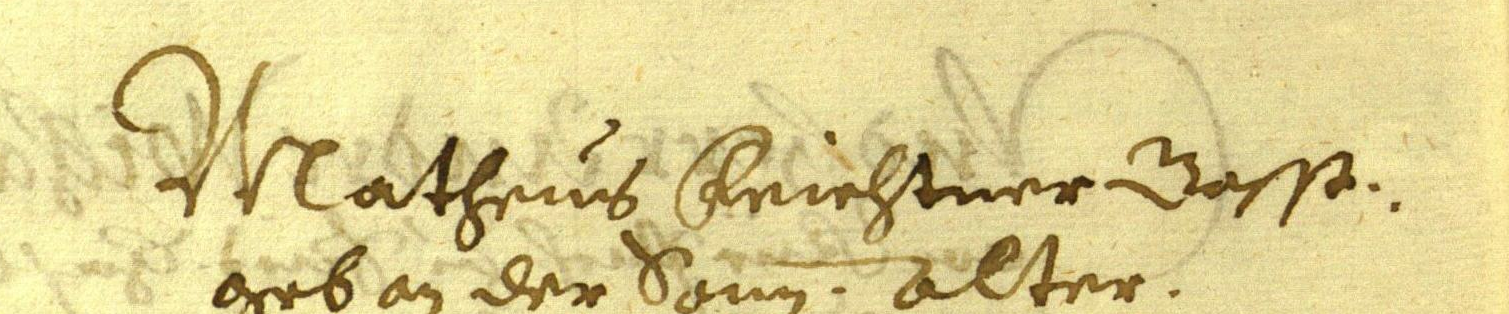Matheūs Feichtner Gasst¬
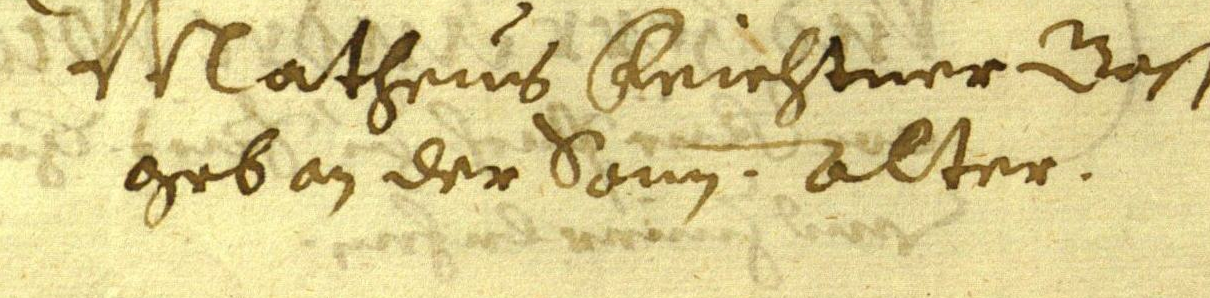geb an der Sonn. Alter.
